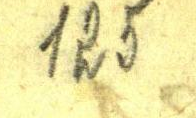125
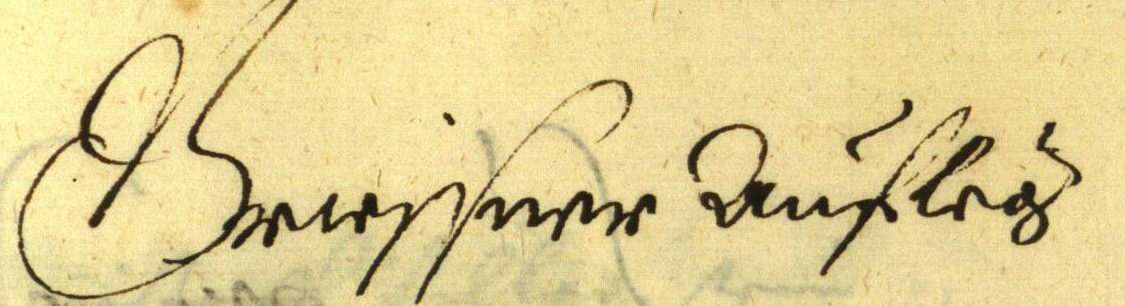Griessner Aūfleg
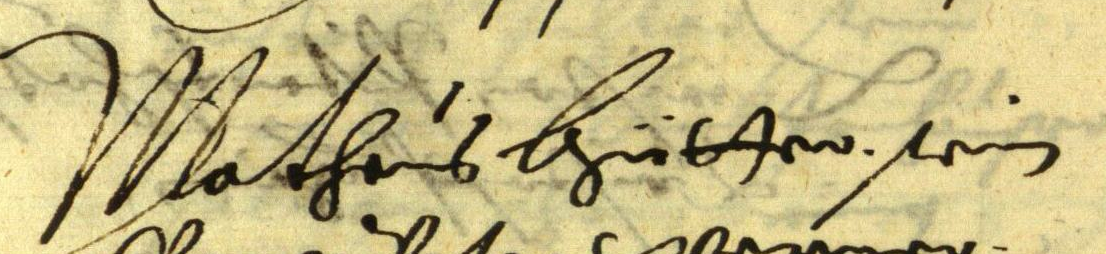Matheūs Hütter. sein
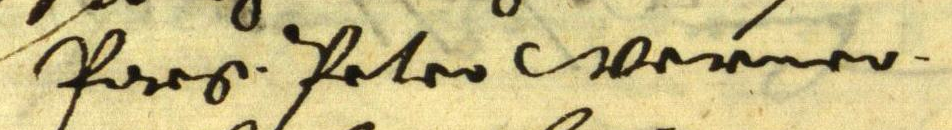Porg. Peter Werner.
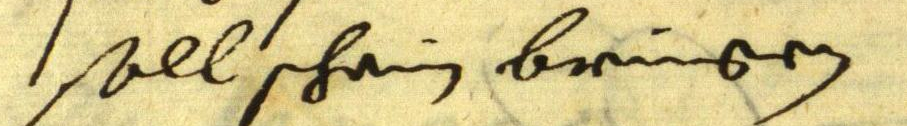soll schein bringen
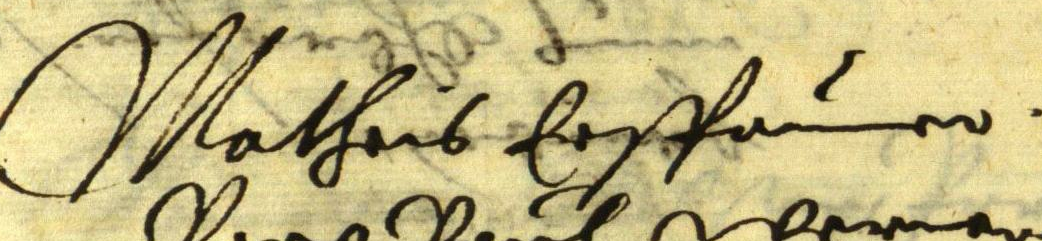Matheis ErsPaūmer.
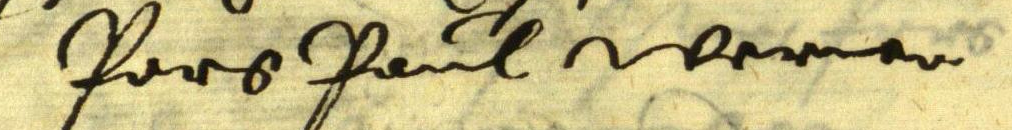Porg Paūl Werner.
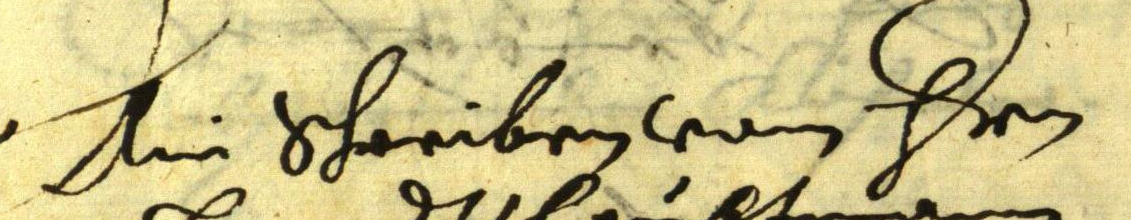Ain Schreiben vom hn
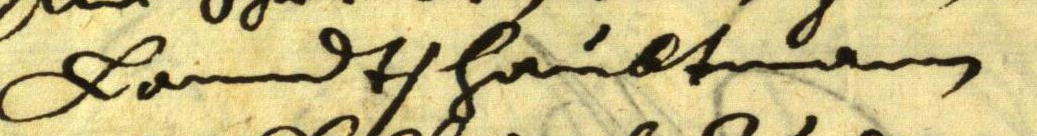Lanndtshaūbtmann
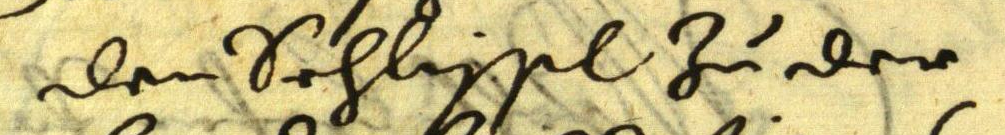den Schlissl Zū der
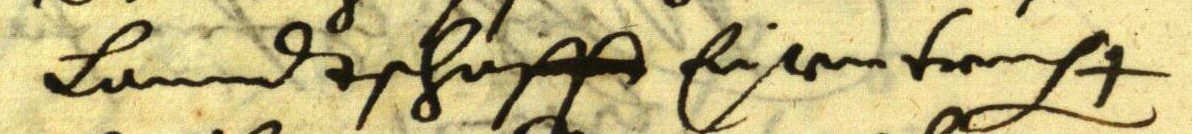Lanndtschafft Eisen trūh
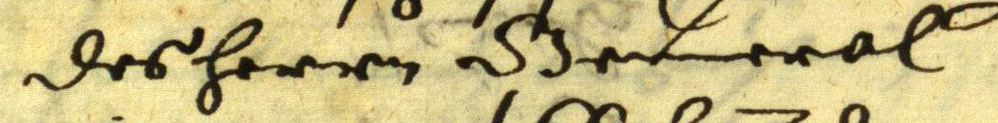des herrn Genneral
